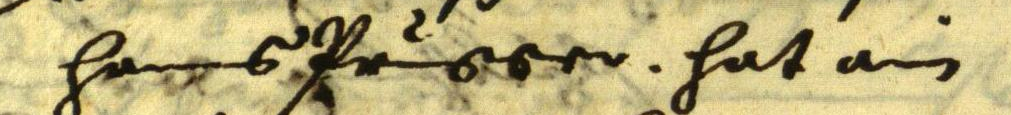Hanns Prūgger. hat ain
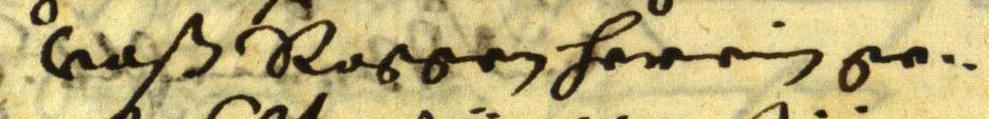vaß Roggen herein ge¬
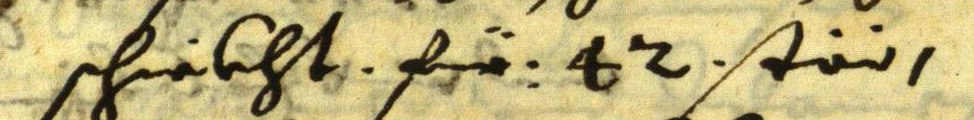schickht. für: 42. stär,
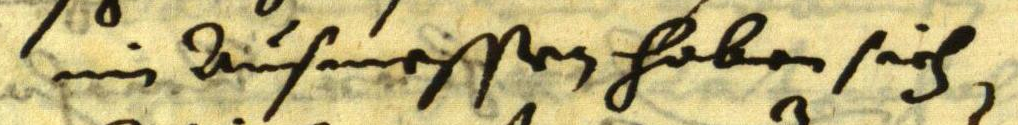im Aūsmessen haben sich
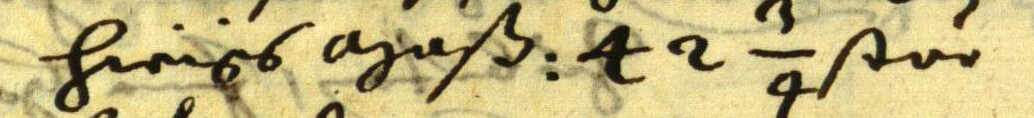hieigs Maß: 42 ¾ stār
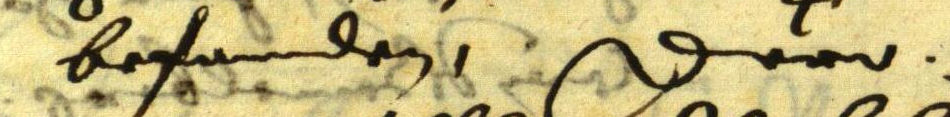befonnden, Dero¬
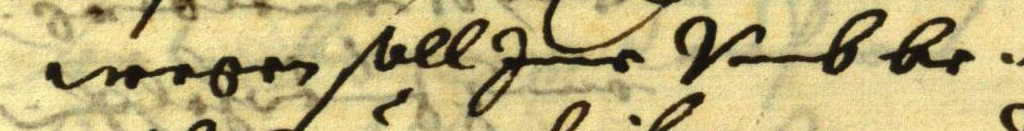wegen soll Ime Vmb be¬
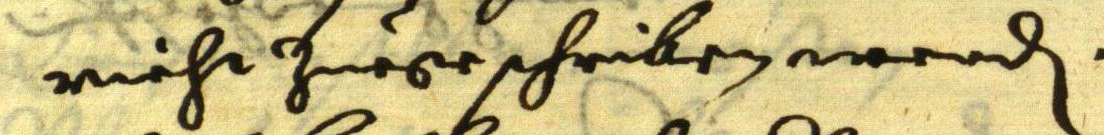richt Zūegeschriben werd.
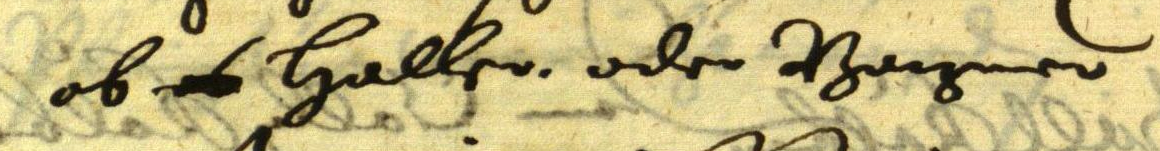ob es Haller. oder Bozner
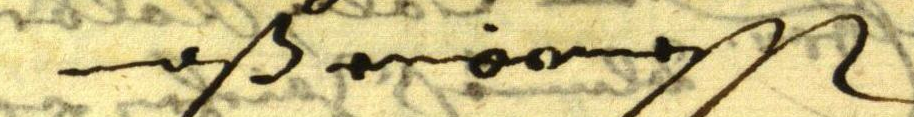maß eingemess.
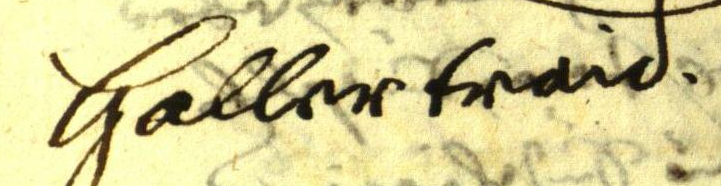Haller traid.
